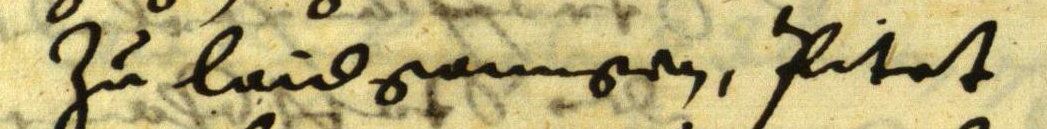Zū laid ganngen, Pitet
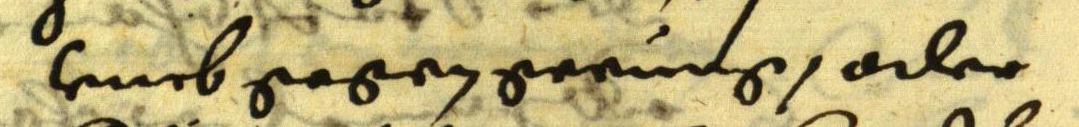vmb gegen gerūng, oder
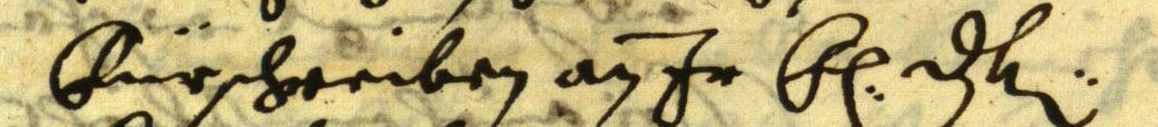Fürschreiben an Ir Fl: dlt:
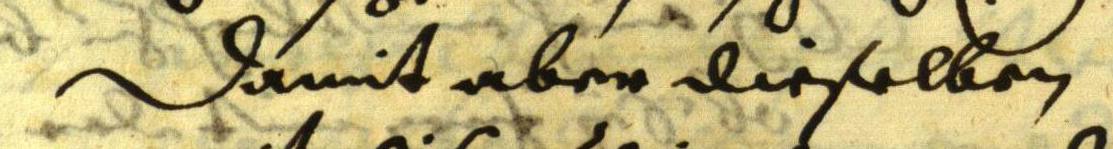Damit aber diselben
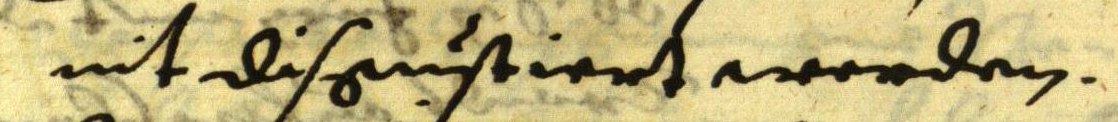nit disgūstiert werden.
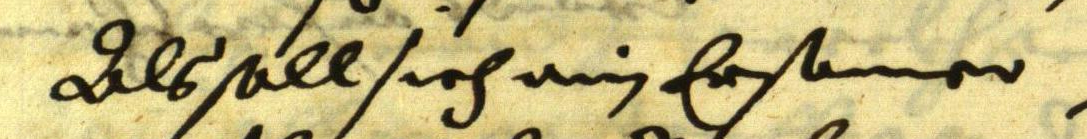Als soll sich ain Ersamer
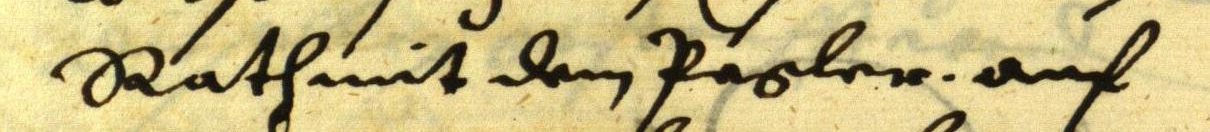Rath mit dem Pagler. aūf
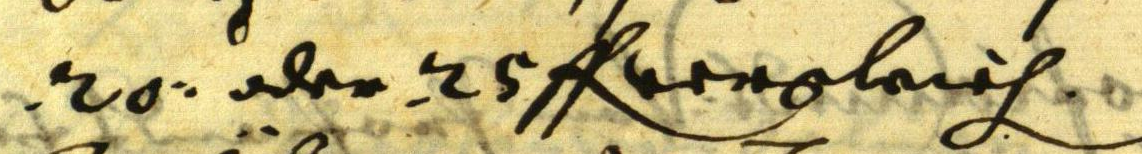.20: oder .25 fl vergleich.
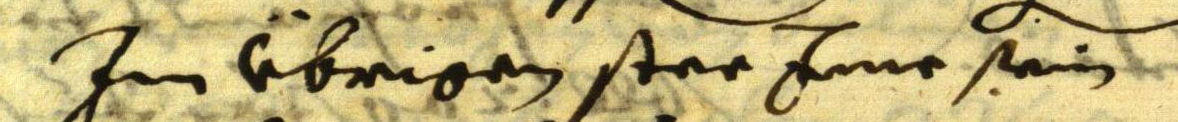Im v̈brigen stee Ime sein
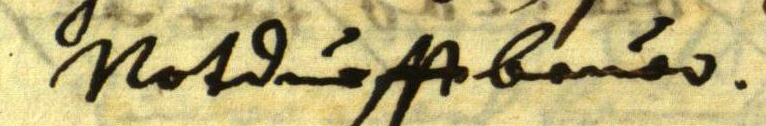Notdūrfft beūor.
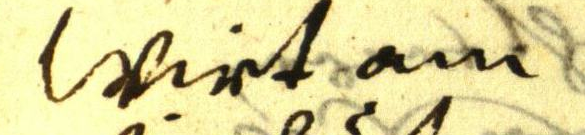Wirt am
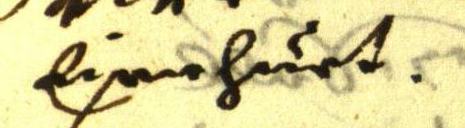Eisenhūet.
